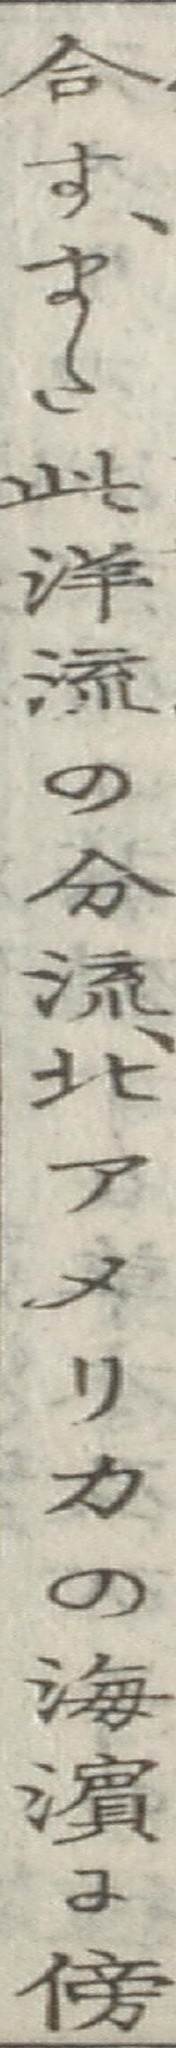合す、また此洋流の分流、北アメリカの海浜に傍
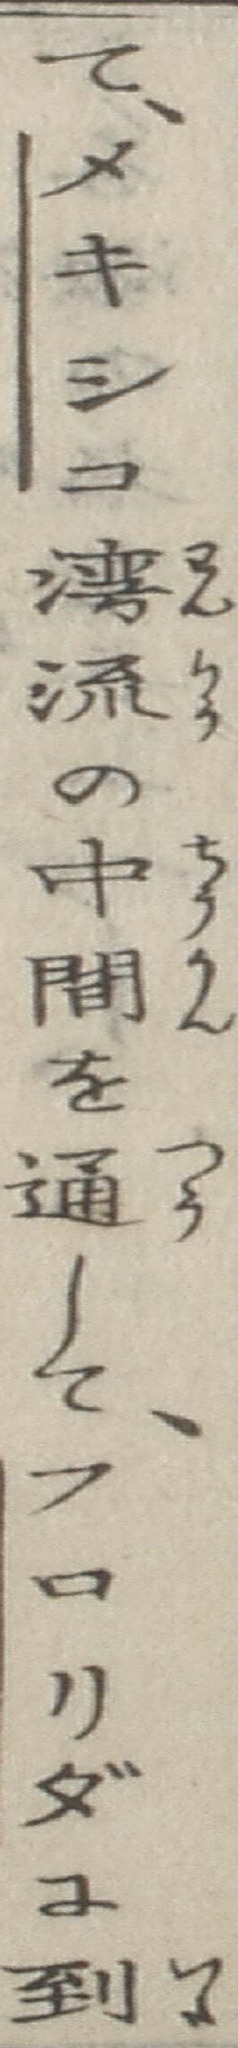て、メキシコ湾流の中間を通して、フロリダに到
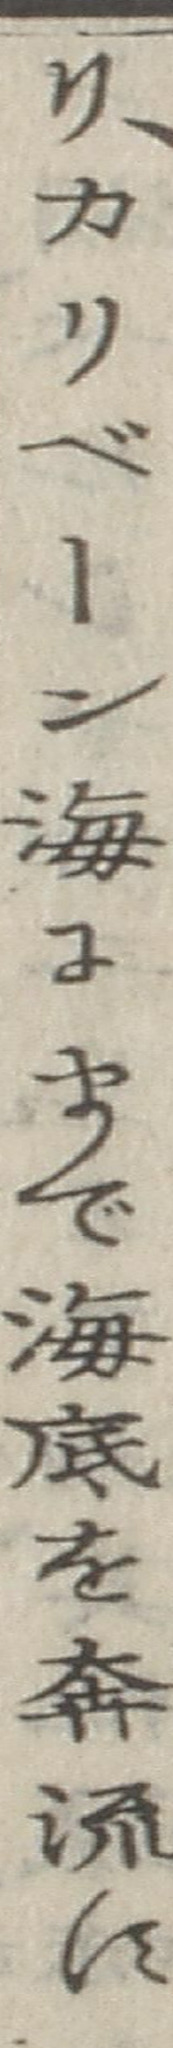り、カリベーン海にまで海底を奔流す、
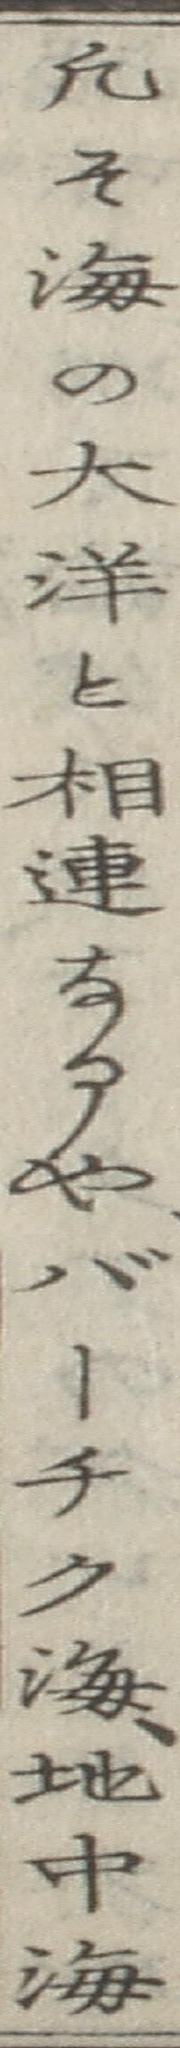凡そ海の大洋と相連なるや、バーチク海、地中海
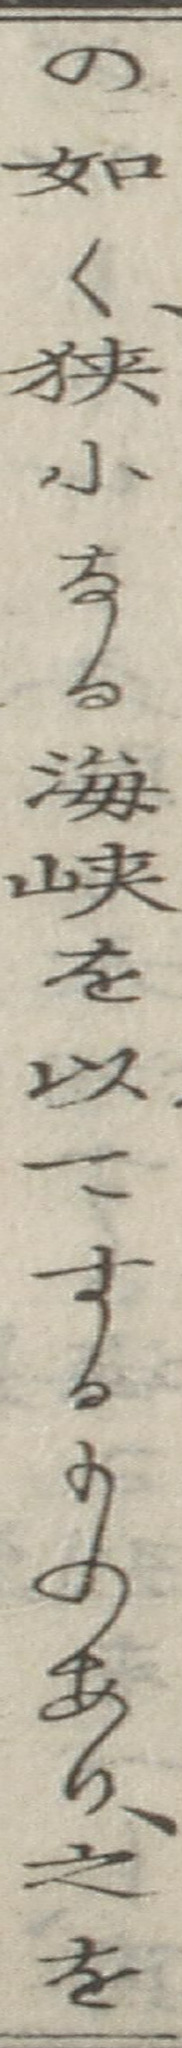の如く、狭小なる海峡を以てするものあり、之を
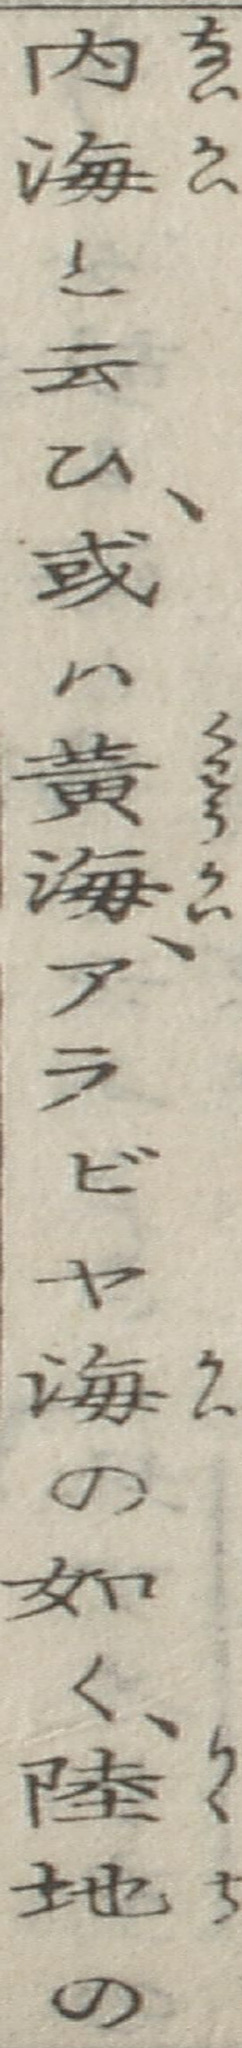内海と云ひ、或は黄海、アラビヤ海の如く、陸地の
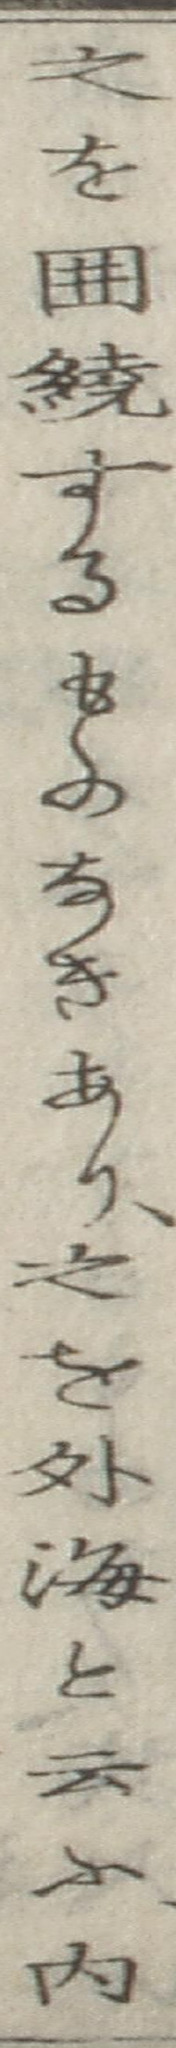之を囲繞するものなきあり、之を外海と云ふ、内
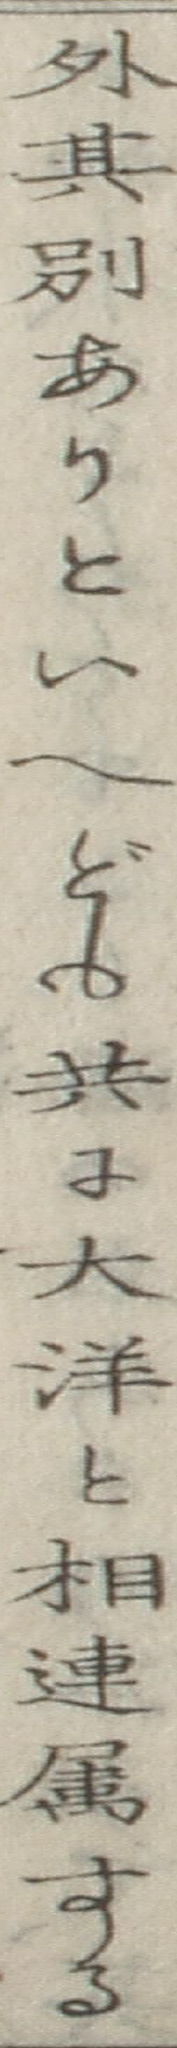外其別ありといへども、共に大洋と相連属する
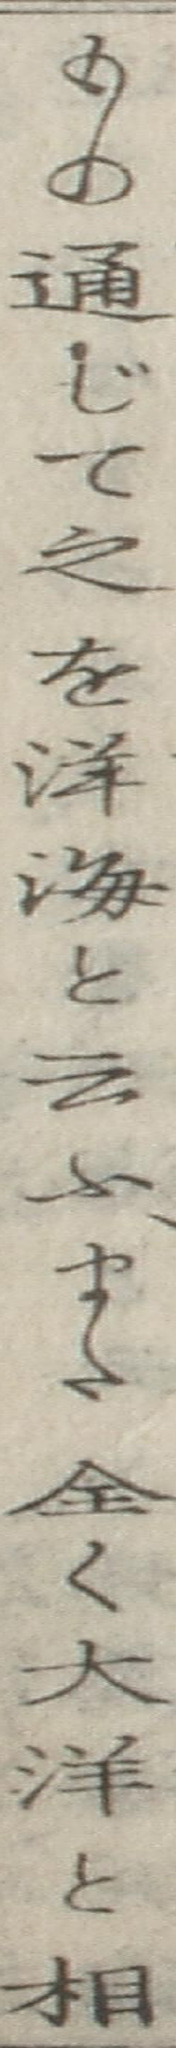もの、通じて之を洋海と云ふ、また全く大洋と相

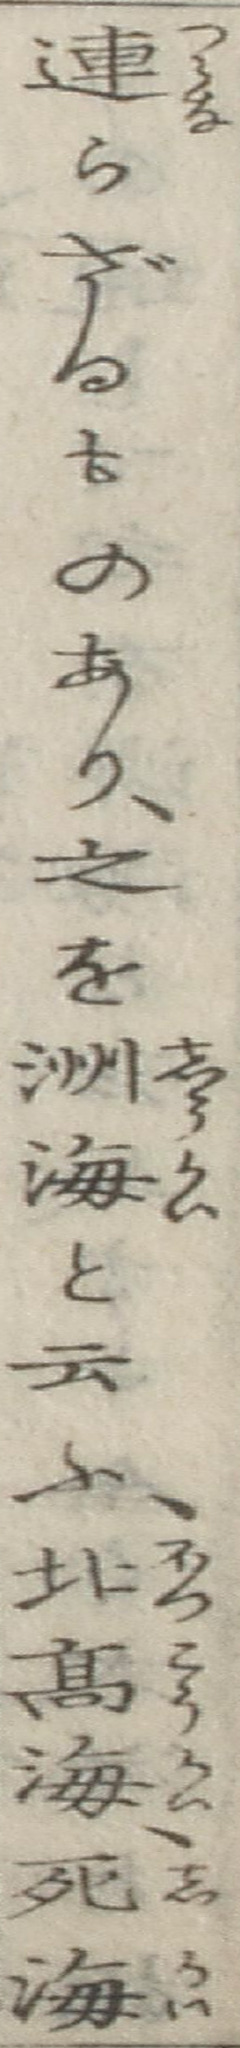連らざるものあり、之を洲海と云ふ、北高海、死海
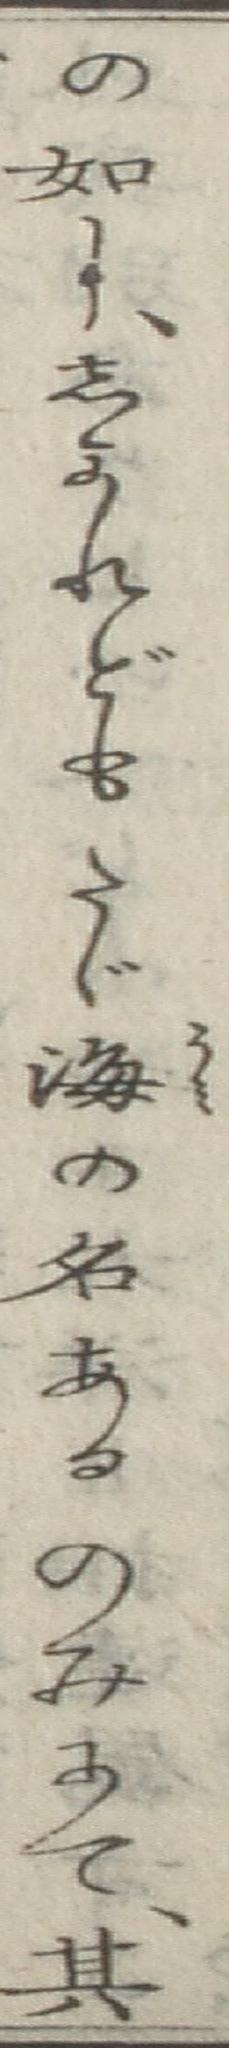の如し、しかれどもたゞ海の名あるのみにて、其
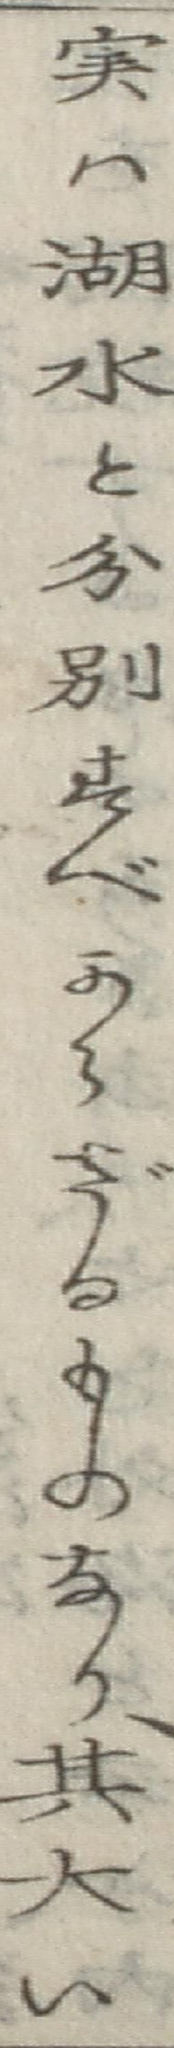実は湖水と分別すべからざるものなり、其大に
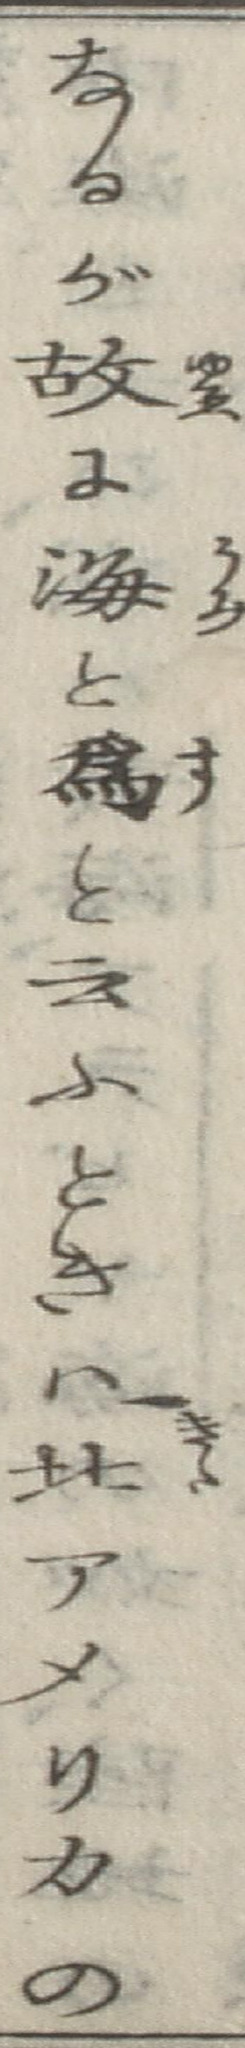なるが故に海と為と云ふときは、北アメリカの
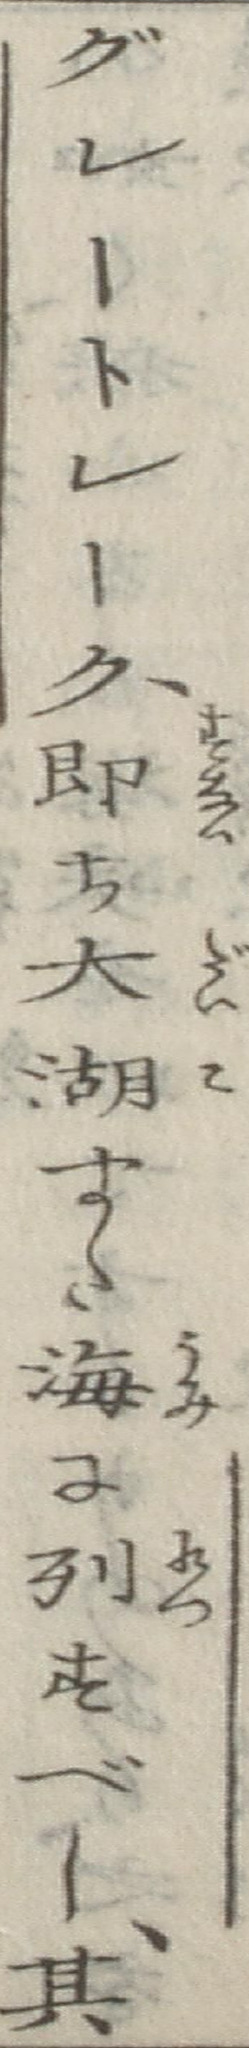グレートレーク、即ち大湖また海に列すべし、其
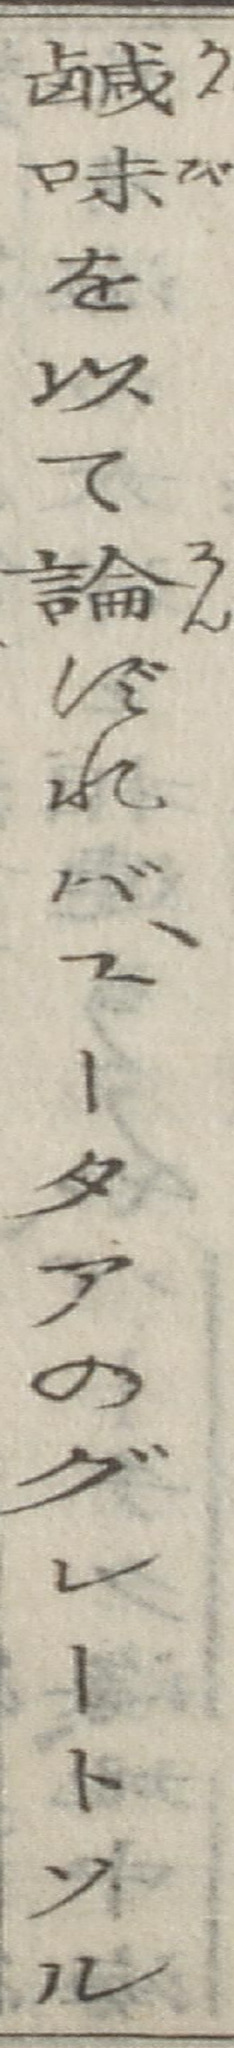鹹味を以て論ずれば、ユータアのグレートソル
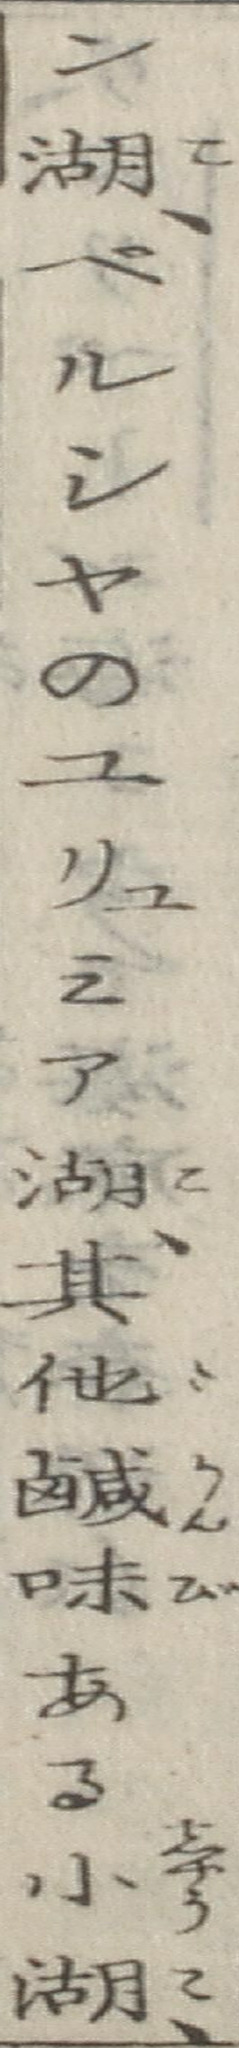ン湖、ペルシヤのユリュミア湖、其他鹹味ある小湖、
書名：訓蒙　天然地理學　中
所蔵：東京大学地震研究所図書室 Earthquake Research Institute Library, The University of Tokyo, JAPAN
